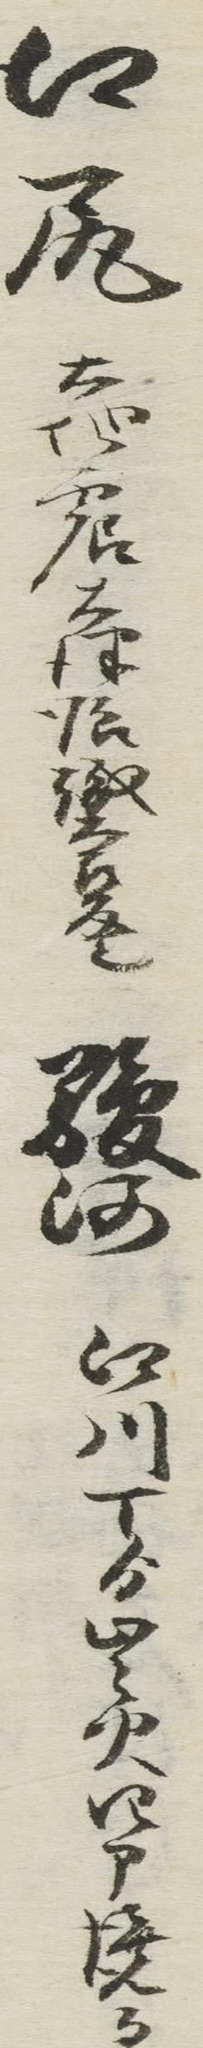江尻大地震大津浪誠大変也駿河江川丁ゟ出火四部焼る
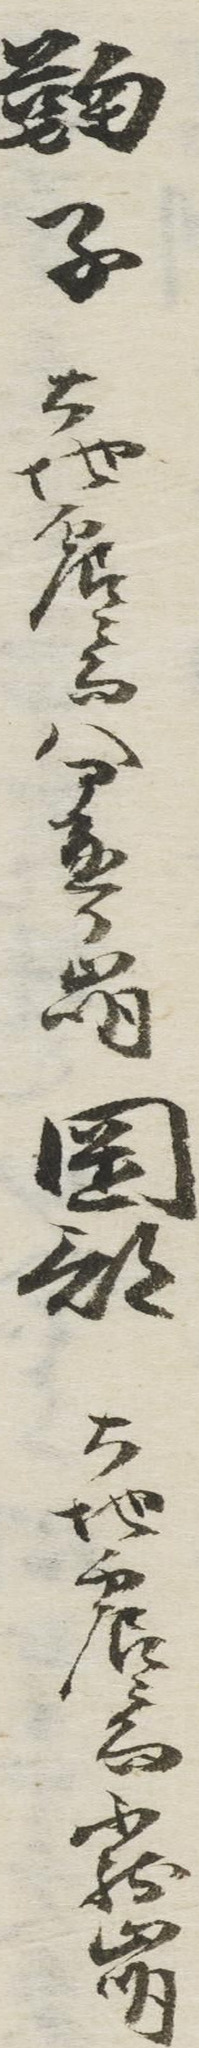鞠子大地震ニ而八部通り崩岡部大地震ニ而不残崩
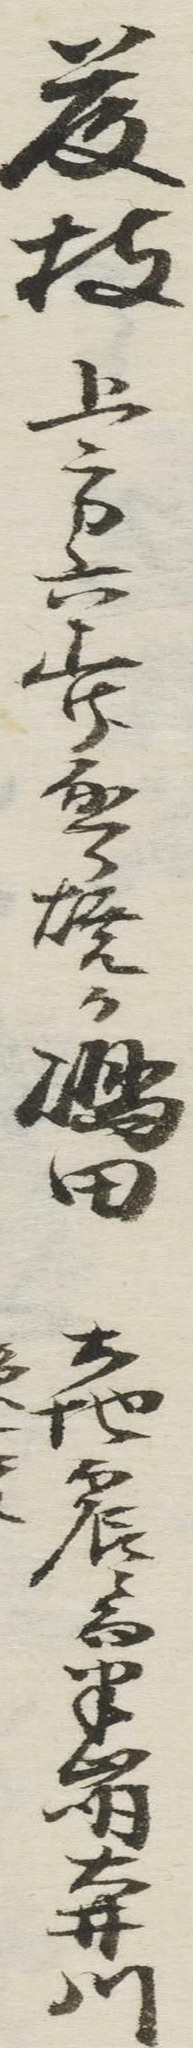藤枝上方六歩通り焼ク嶋田大地震ニ而半崩大井川
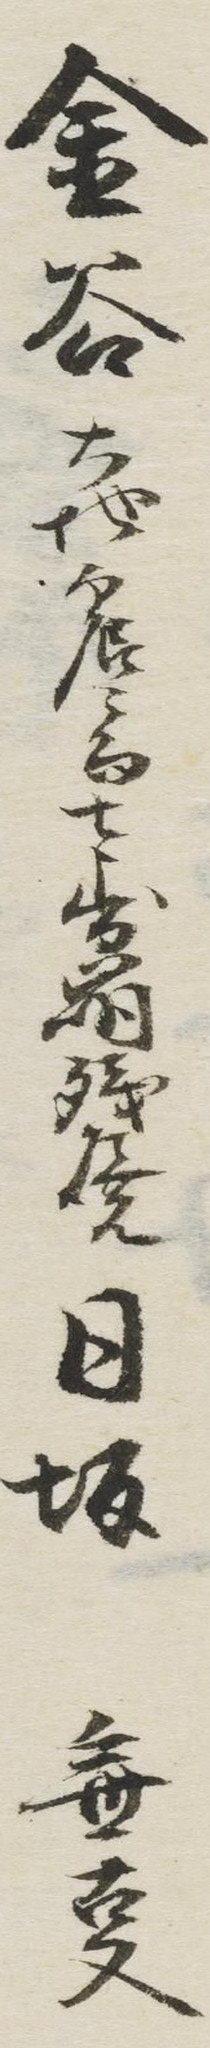金谷大地震ニ而七歩崩残焼日坂無事
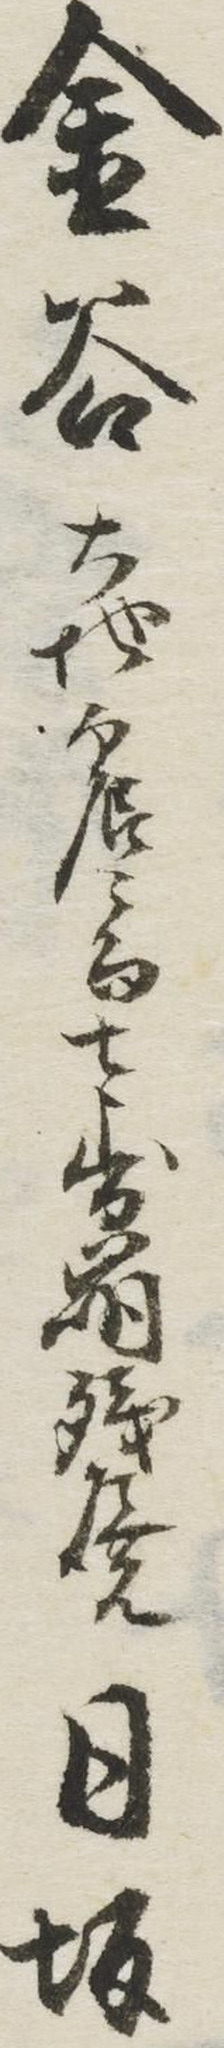金谷大地震ニ而七歩崩残焼日坂無事
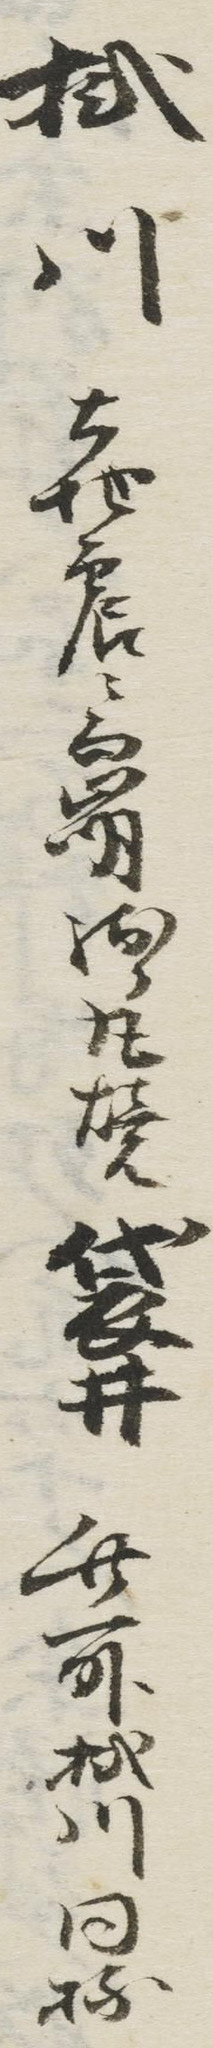掛川大地震ニ而崩残り丸焼袋井此所掛川同様
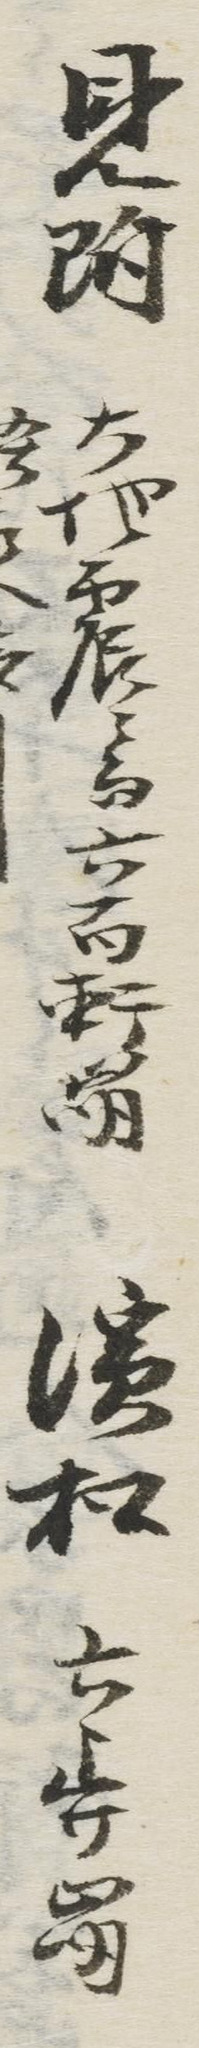見附大地震ニ而六百軒崩浜松六歩崩
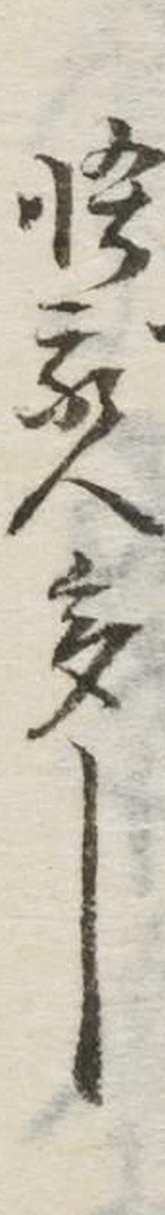怪我人多し
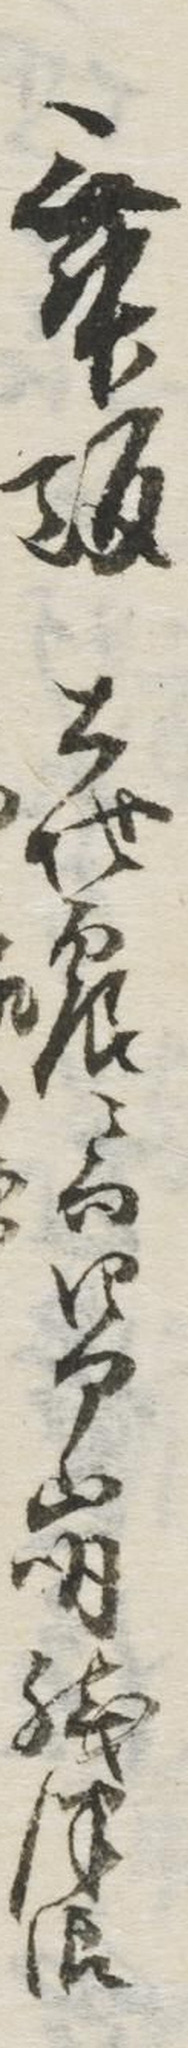舞坂大地震ニ而四部崩残津浪四
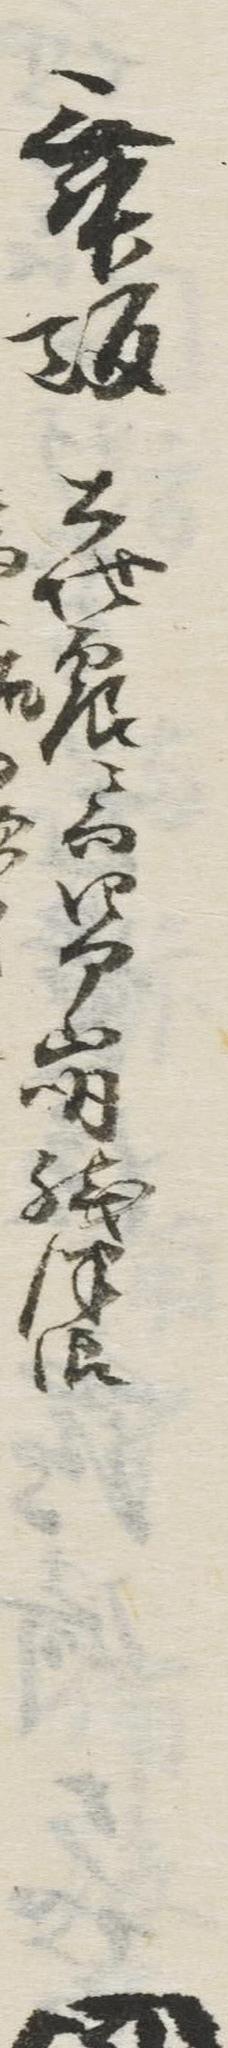舞坂大地震ニ而四部崩残津浪四
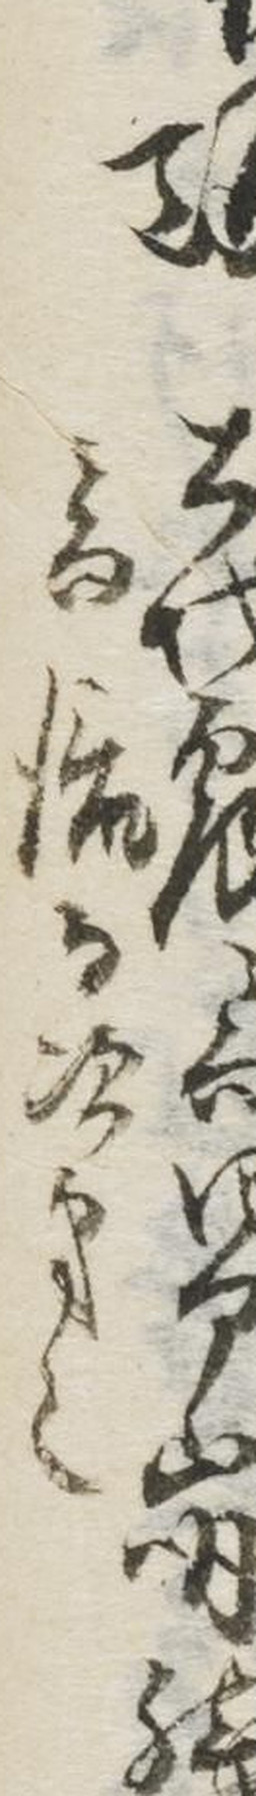ニ而流る次第也
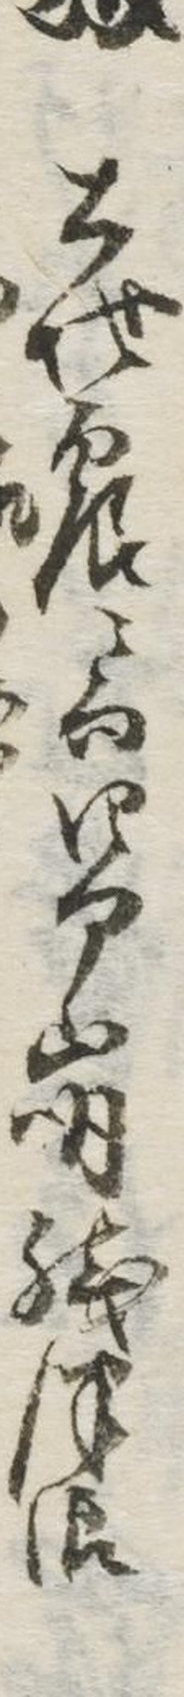舞坂大地震ニ而四部崩残津浪四
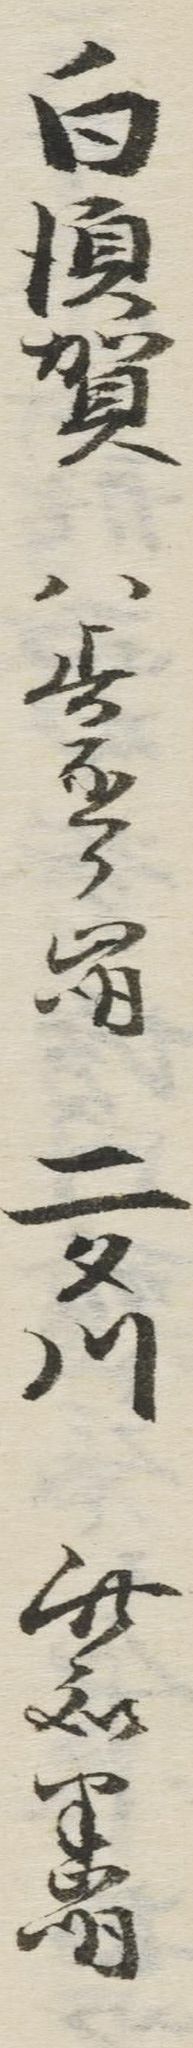白須賀八歩通り崩二タ川此処半崩
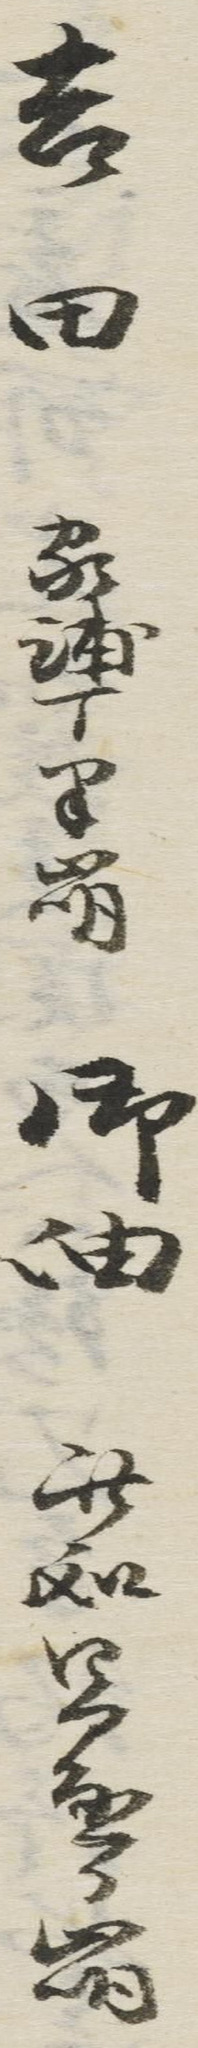吉田家鋪丁半崩御油此処四部通り崩
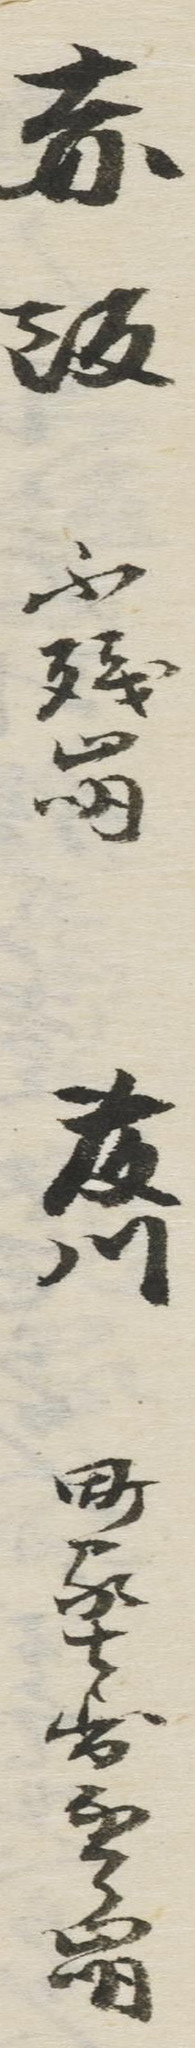赤阪不残崩藤川町家七歩通り崩
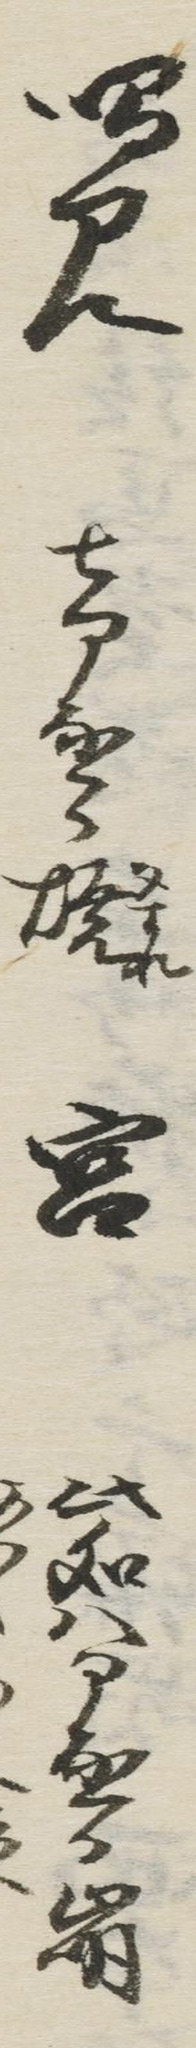鳴見七部通り焼宮此処八部通り崩
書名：諸国大地震大津波一代記
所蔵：東京大学地震研究所図書室 Earthquake Research Institute Library, The University of Tokyo, JAPAN
